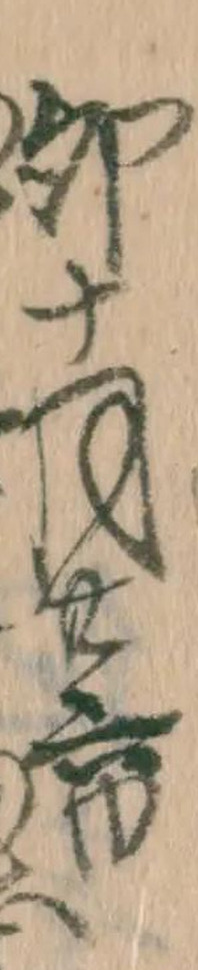卯十月廿六日
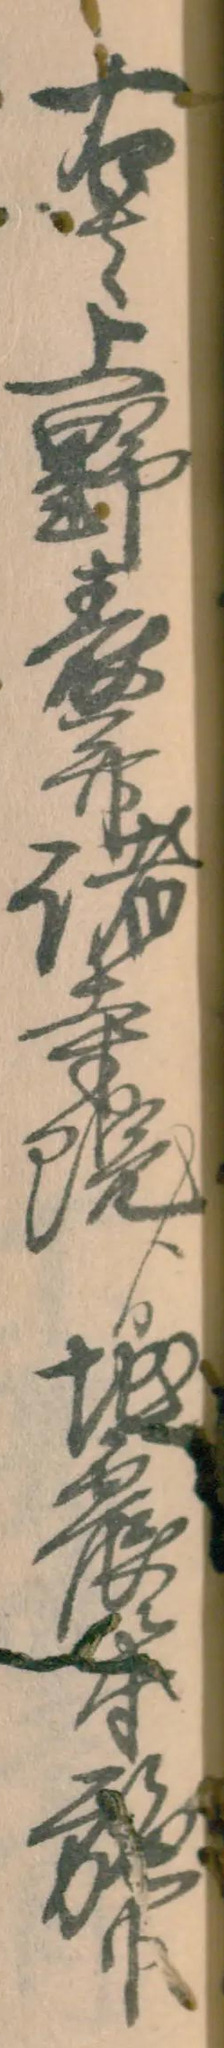右は上野表并諸寺院ゟ地震ニ付施候
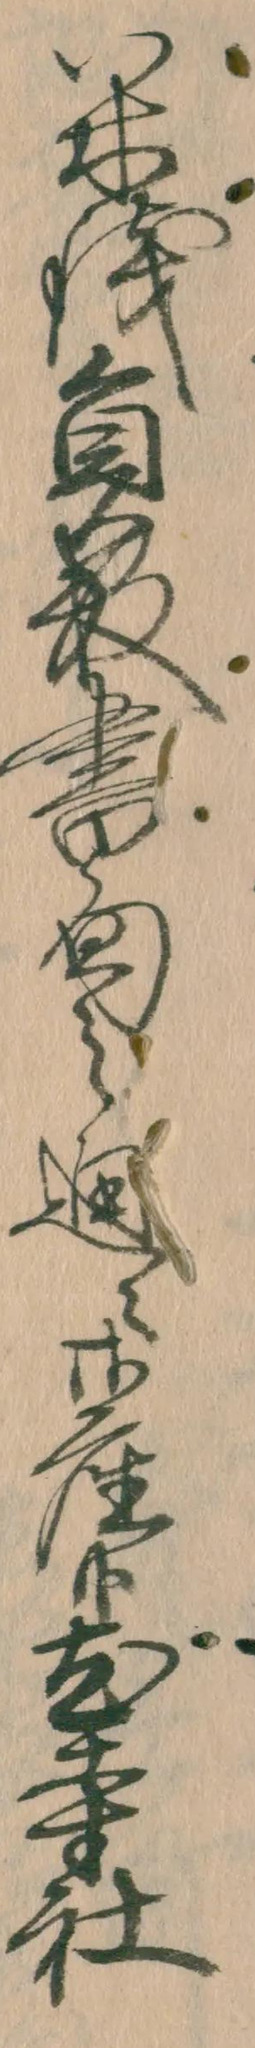米銭員数書面之通ニ御座候尤寺社
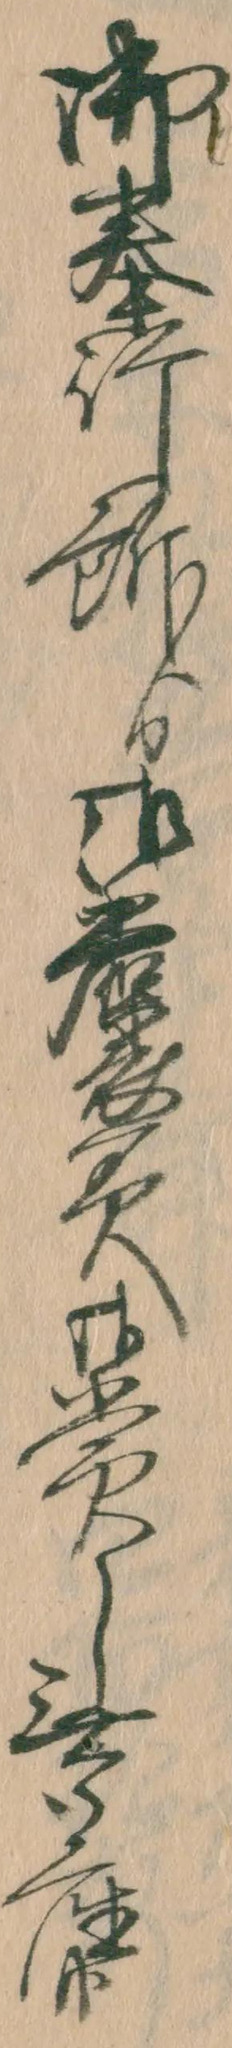御奉行所ゟ御褒美御賞し無御座候

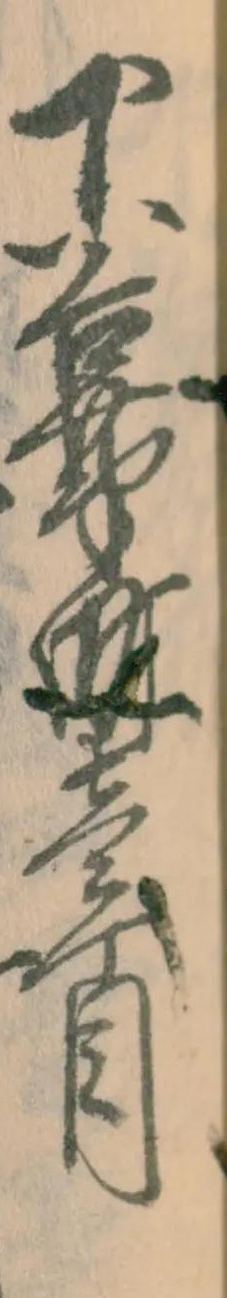下谷茅町壱丁目
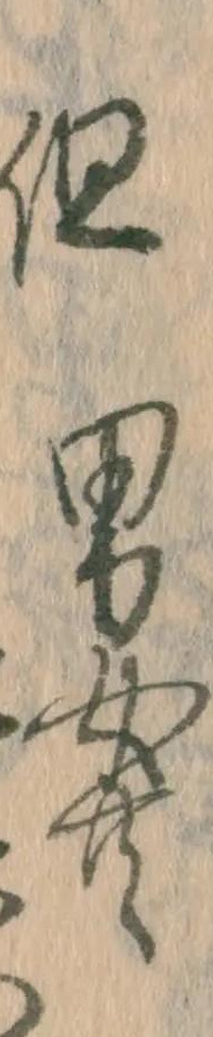但男女共
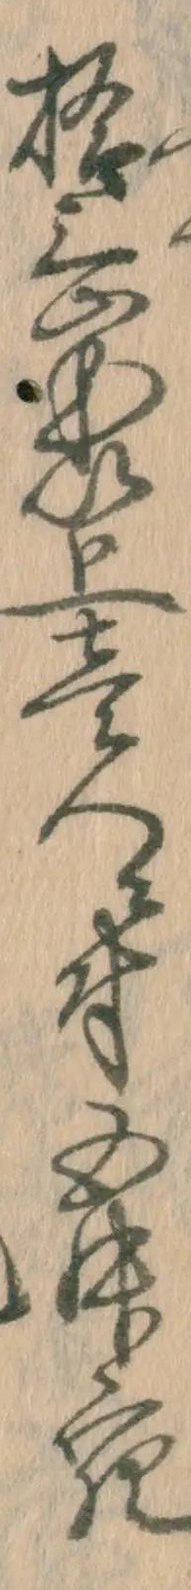拾三歳以上壱人ニ付五升宛
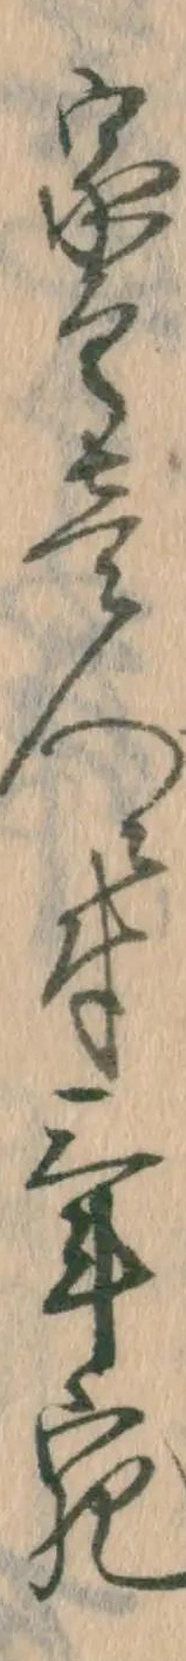家主壱人ニ付三斗宛
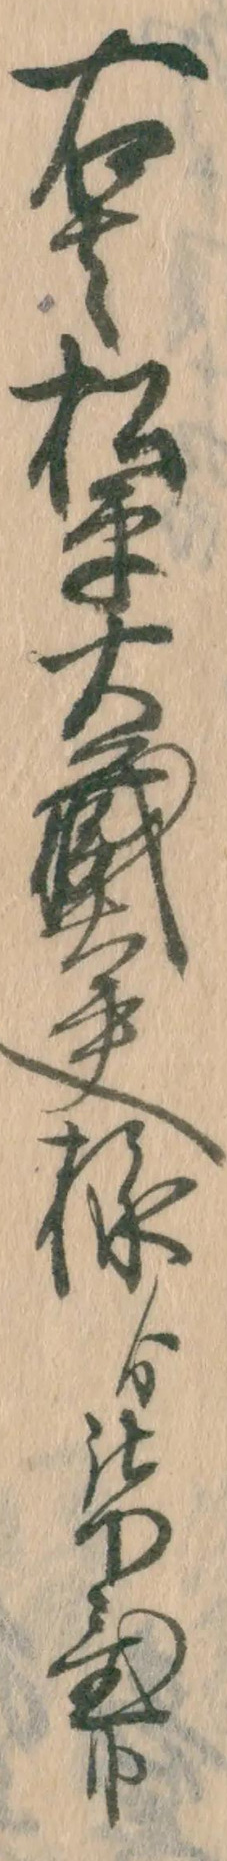右は松平大蔵大夫様ゟ被下置候

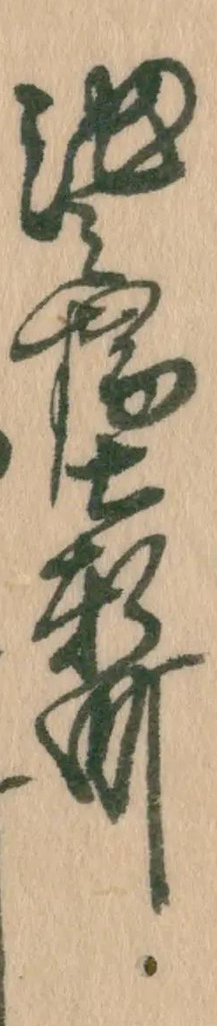池之端七軒町
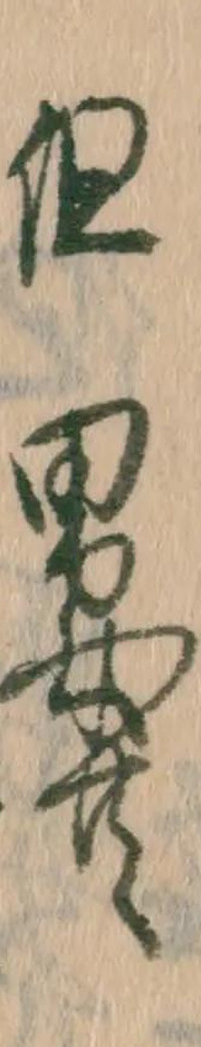但男女共
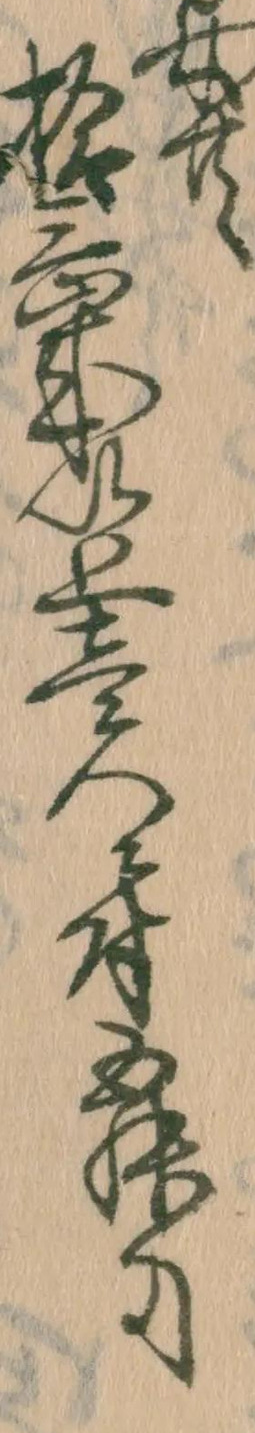拾三歳以上壱人ニ付五升ツヽ
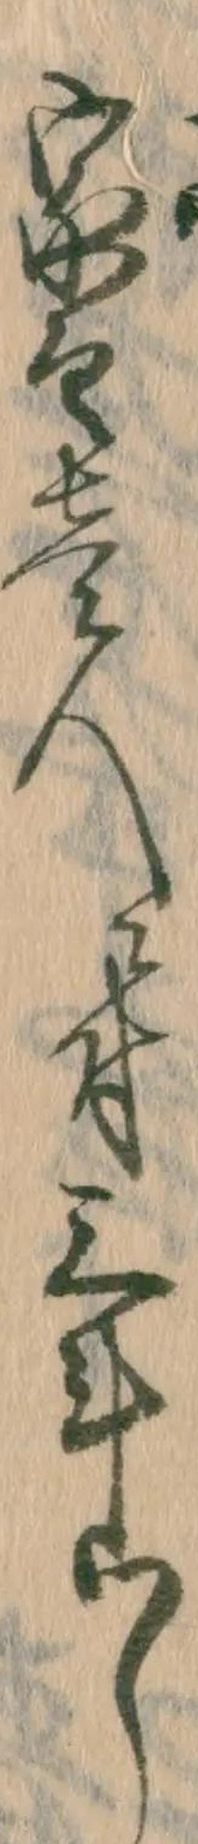家主壱人ニ付三斗ツヽ
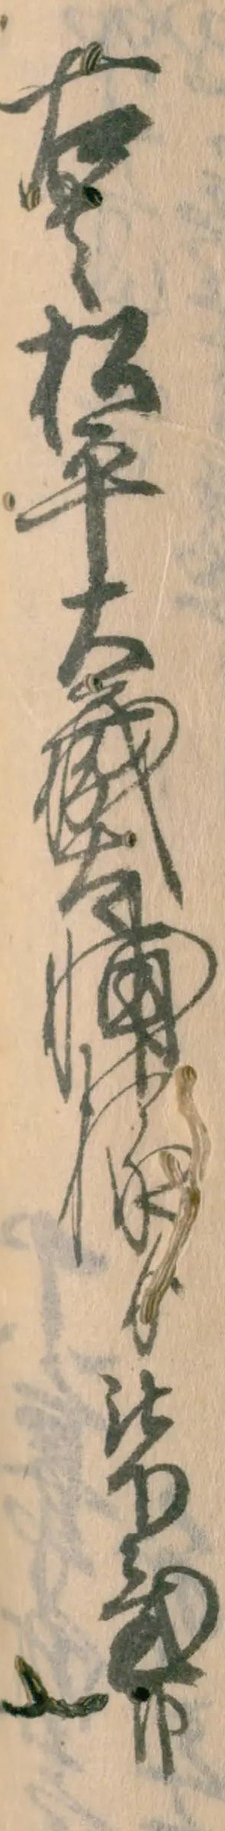右は松平大蔵太輔様ゟ被下置候
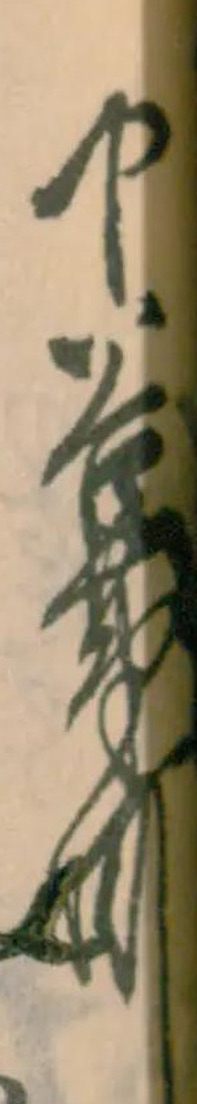下谷茅町
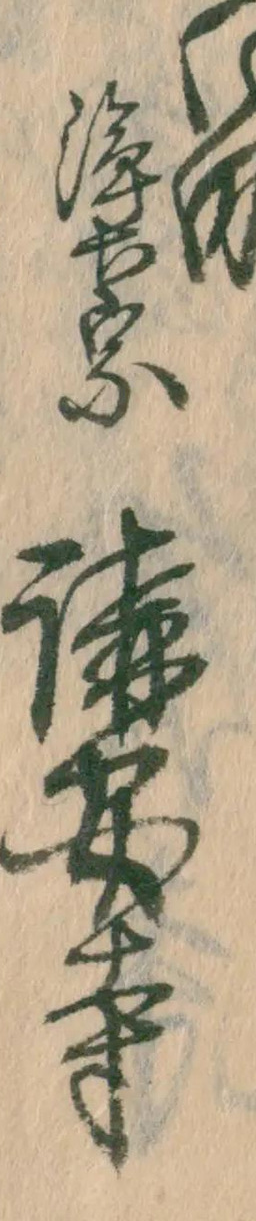浄土宗講安寺
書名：武家方并寺院等ニテ施差出候一件
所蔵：国立国会図書館 National Diet Library, JAPAN
